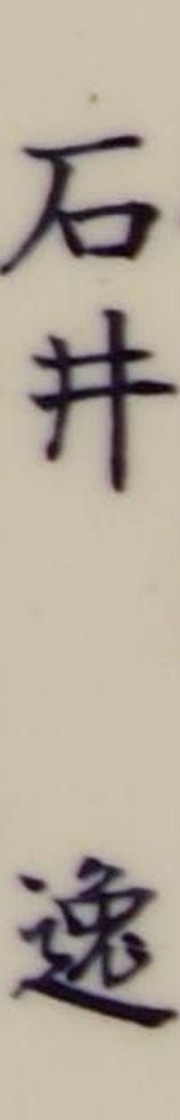石井逸
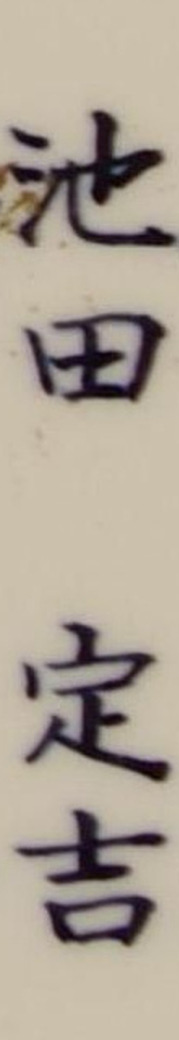池田定吉
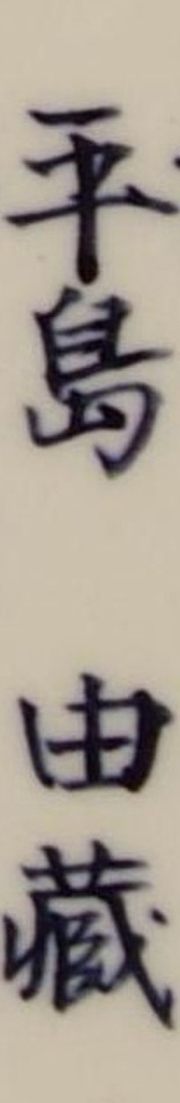平島由蔵
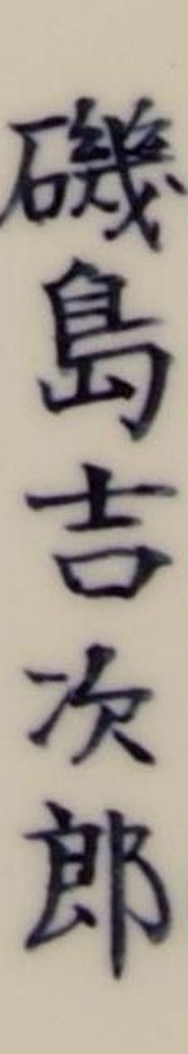磯島吉次郎
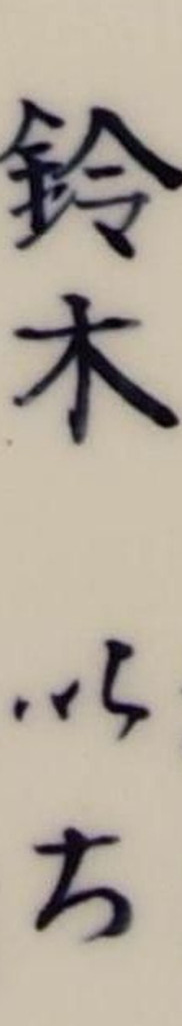鈴木いち
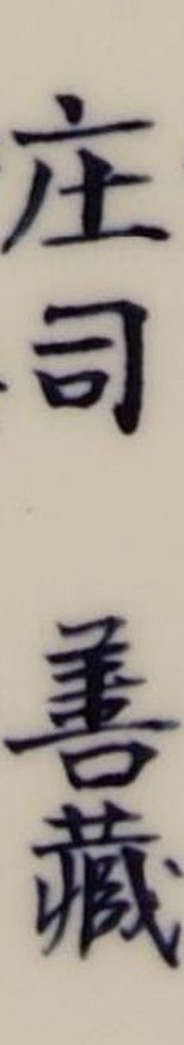庄司善蔵
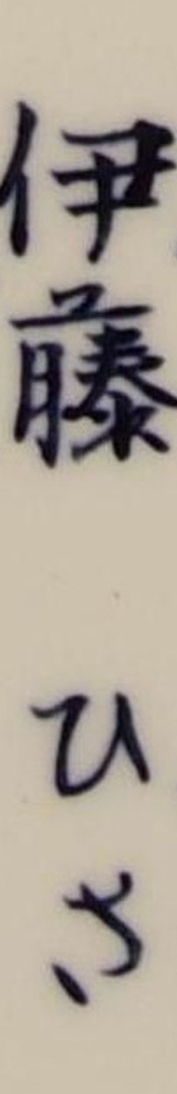伊藤ひさ
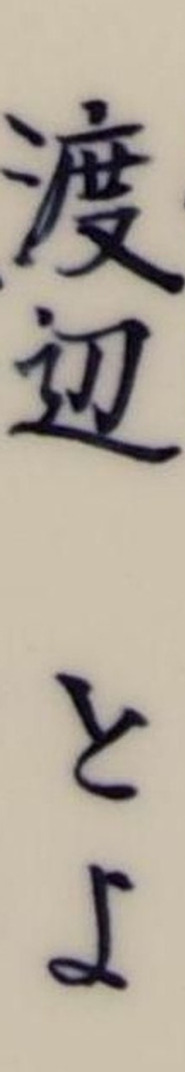渡辺とよ
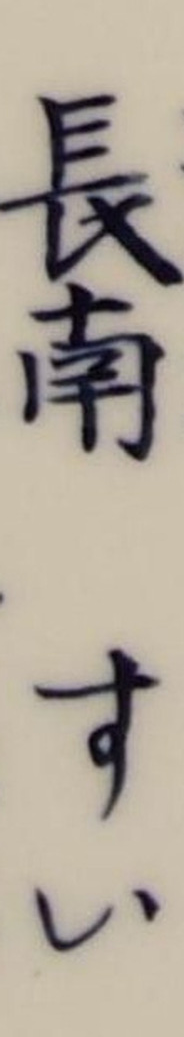長南すい
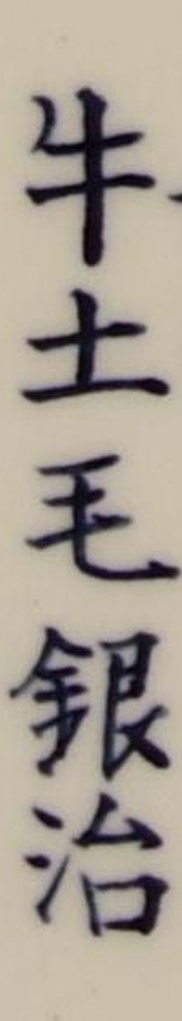牛土毛銀治
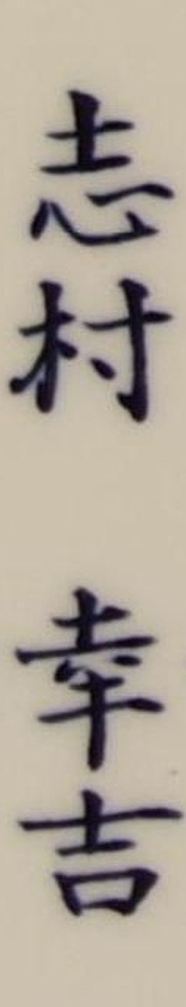志村幸吉
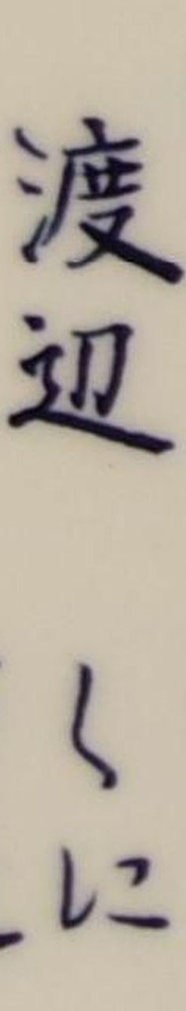渡辺くに

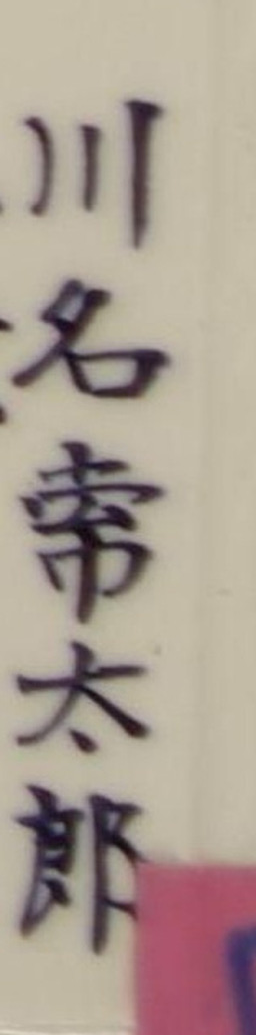川名常太郎
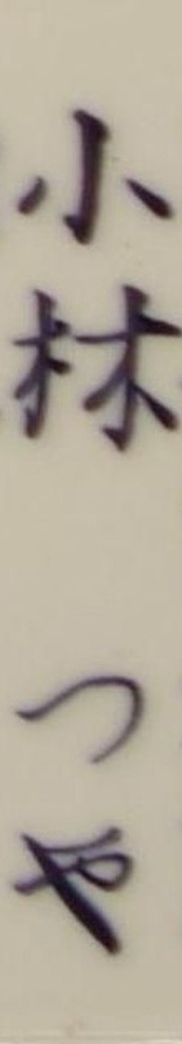小林つや
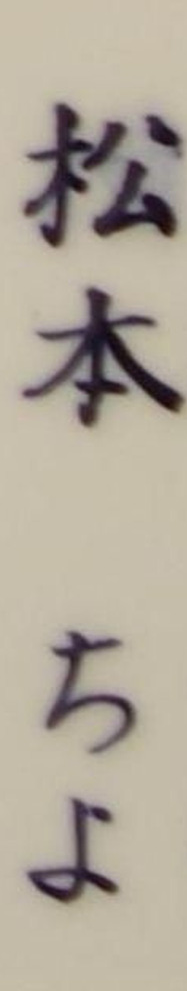松本ちよ
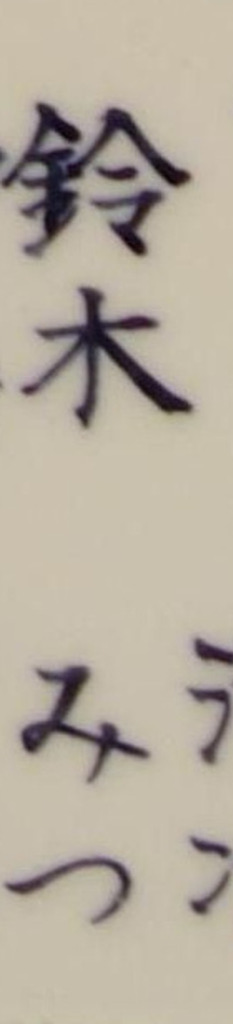鈴木みつ
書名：E~L
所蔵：高野山金剛峯寺
